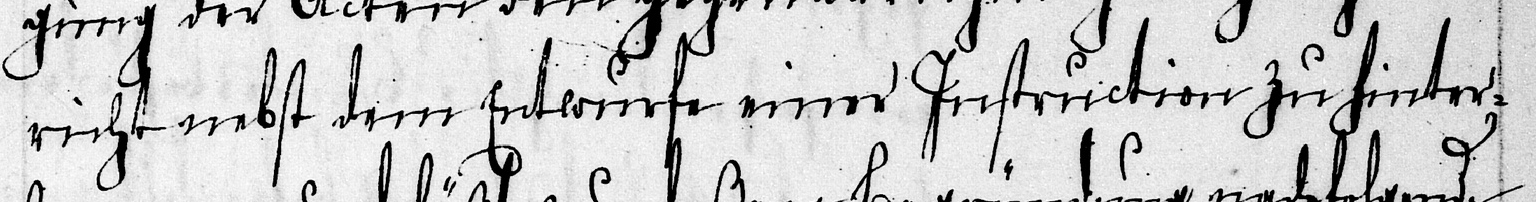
richt nebst dem Entwurfe einer Instruction zu hinter¬
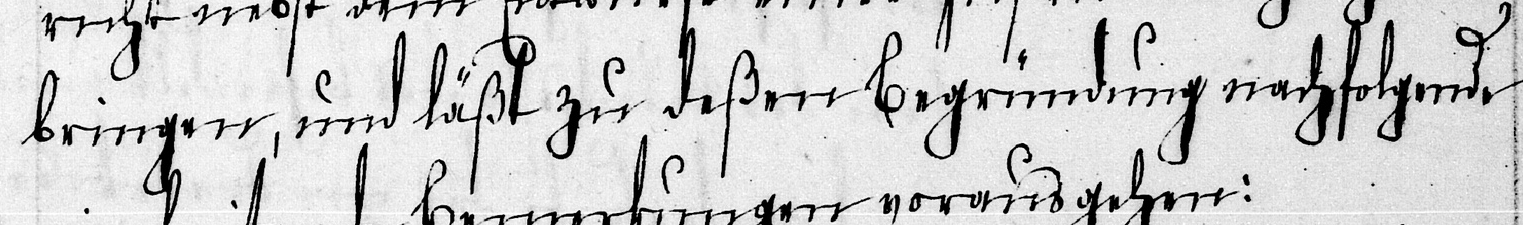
bringen, und läßt zu deßen Begründung nachfolgende
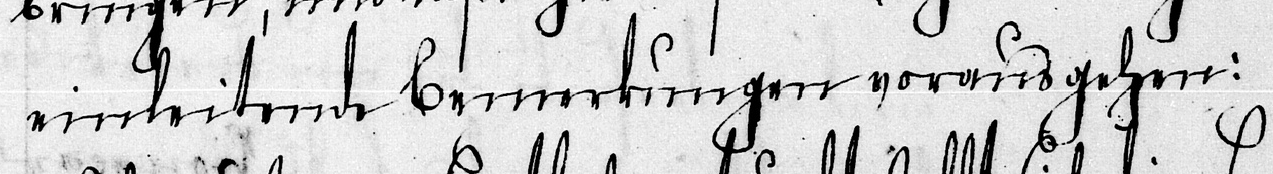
einleitende Bemerkungen vorausgehen:
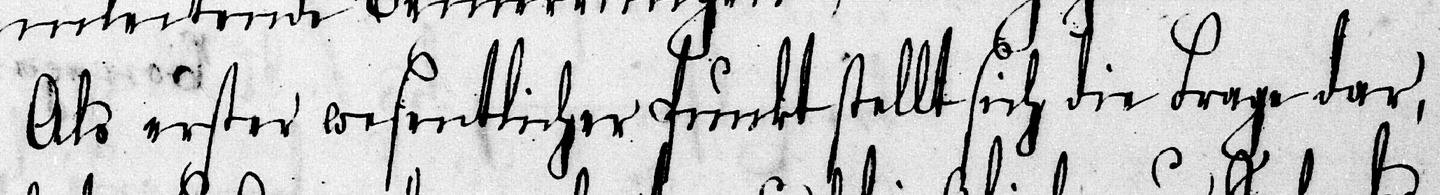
Als erster wesentlicher Punkt stellt sich die Frage dar,
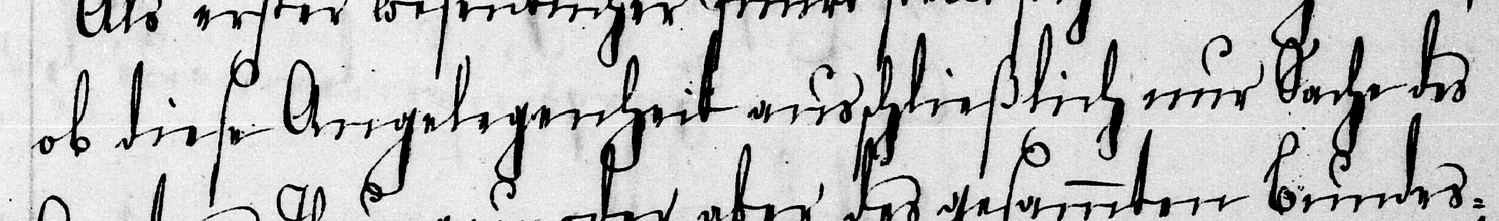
ob diese Angelegenheit ausschließlich nur Sache des
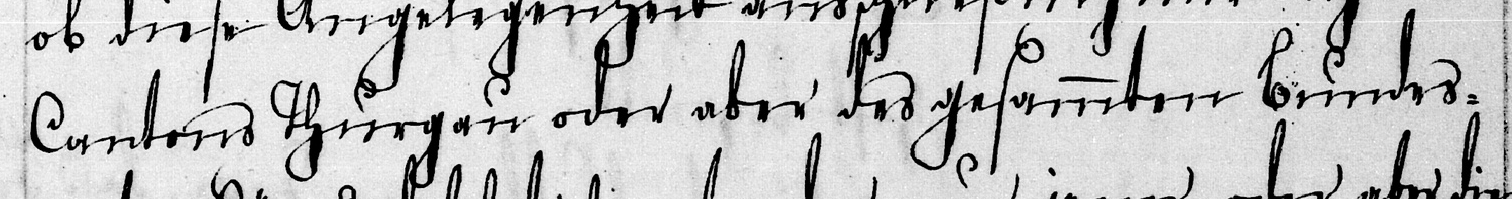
Cantons Thurgau oder aber des gesammten Bundesss¬
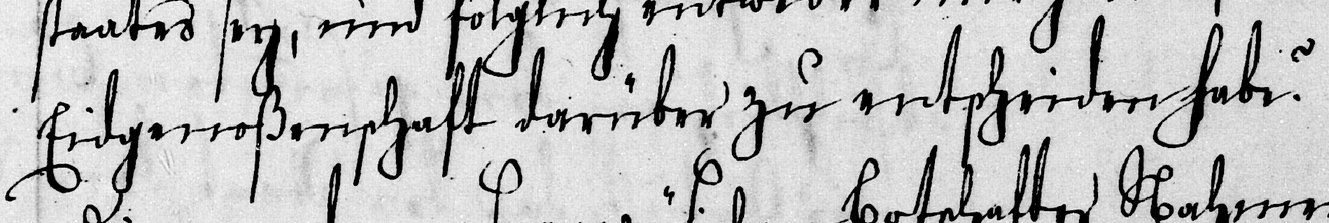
Eidgenoßenschaft darüber zu entscheiden habe?
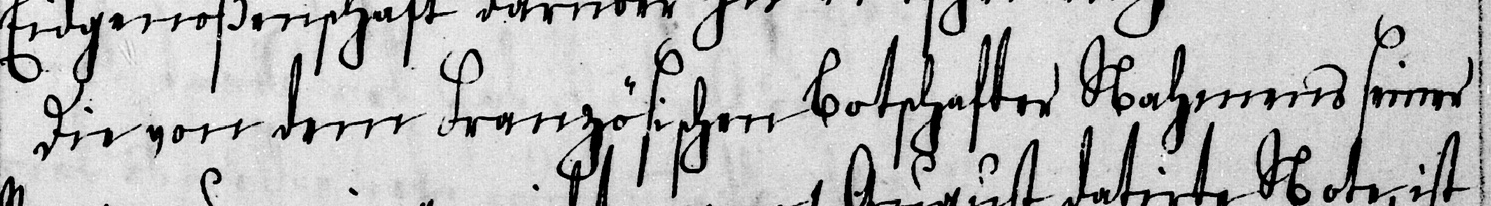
Die von dem Französischen Botschafter Nahmens seiner
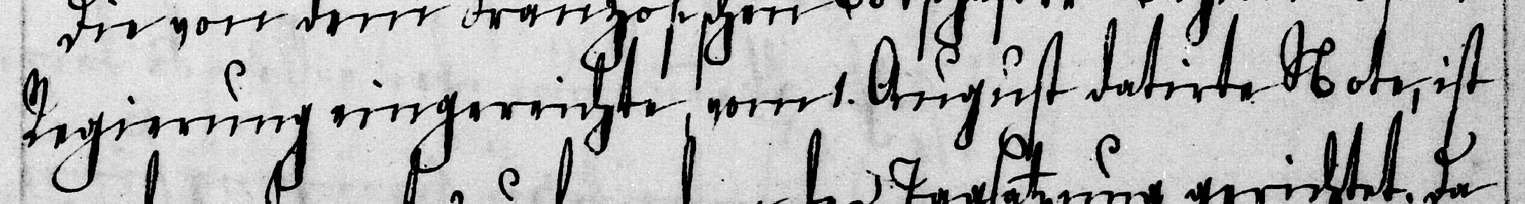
Regierung eingereichte, vom 1. August datirte Note, ist
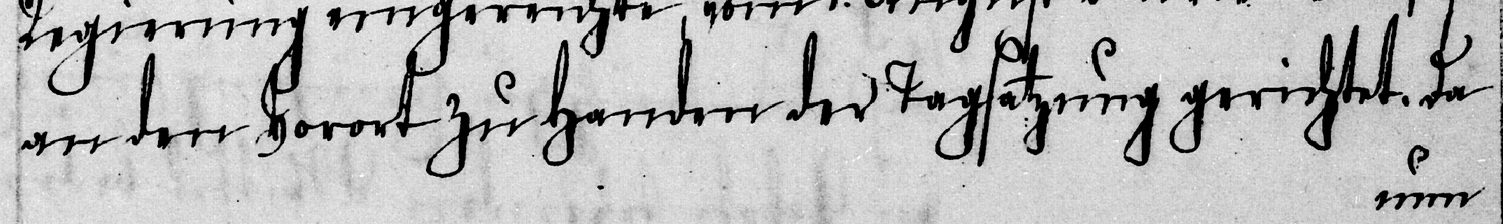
an den Vorort zu Handen der Tagsatzung gerichtet. Da
